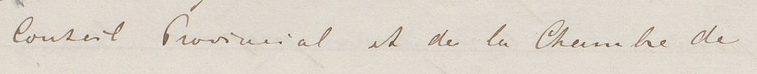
Conseil Provincial et de la Chambre de
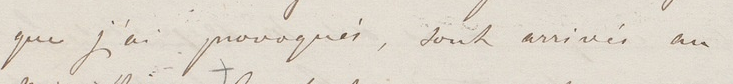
que j'ai provoqués, sont arrivés au
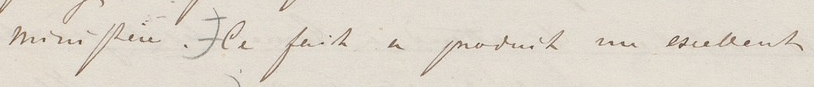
Ministère. Ce fait a produit un excellent
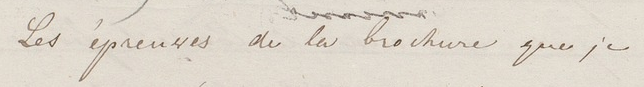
Les épreuves de la brochure que je
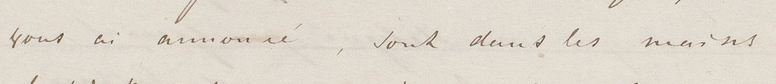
vous ai annoncé, sont dans les mains
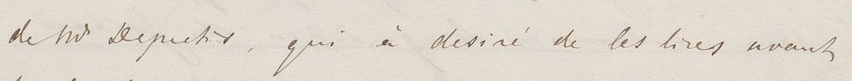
de MrDepretis, qui à desiré de les lire avant
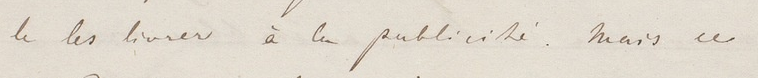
de les livrer à la publicité. Mais ce
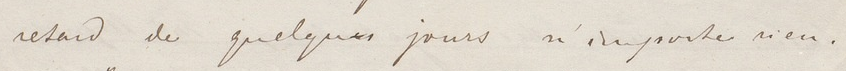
retard de quelques jours n'importe rien.
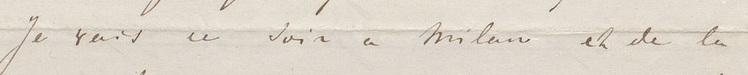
Je vais ce soir a Milan et de la
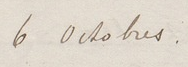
6 Octobres.
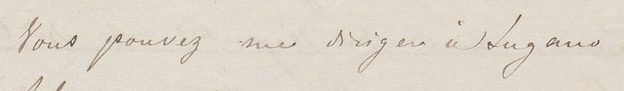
Vous pouvez me diriger à Lugano
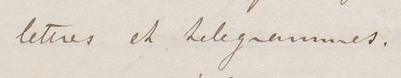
lettres et telegrammes.
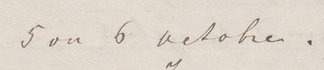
5 ou 6 Octobre.
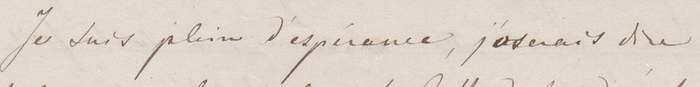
Je suis plein d'espérance, j'oserais dire
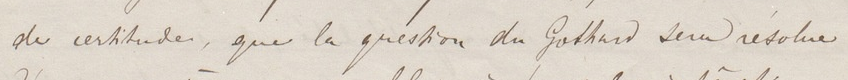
de certitude, que la question du Gothard sera résolue
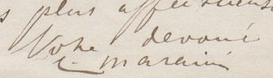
Votre devoué
